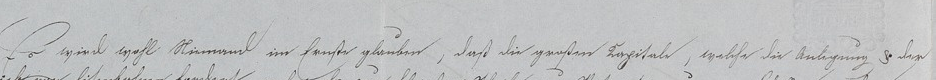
Es wird wohl Niemand im Ernste glauben, daß die großen Kapitale, welche die Anlegung & der
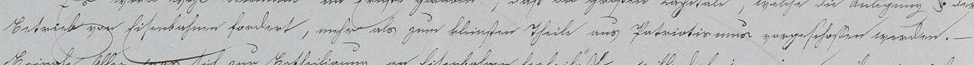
Betrieb von Eisenbahnen fordert, mehr als zum kleinsten Theile aus Patriotismus vorgeschossen werden. –
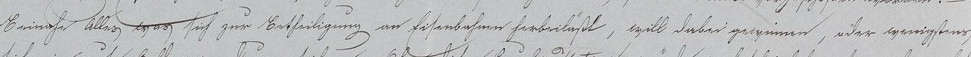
Beinahe Alles, was sich zur Betheiligung an Eisenbahnen herbeiläßt, will dabei gewinnen, oder wenigstens
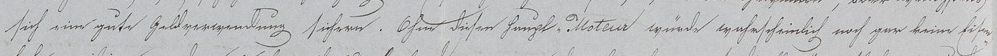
sich eine gute Geldverwendung sichern. Ohne diesen Haupt-Moteur würde wahrscheinlich noch gar keine Eisen-
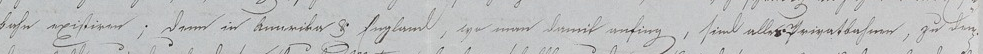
bahn existiren; denn in Amerika & England, wo man damit anfing, sind alles Privatbahnen, zu denen
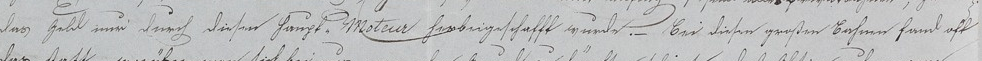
das Geld nur durch diesen Haupt-Moteur herbeigeschafft wurde. – Bei diesen großen Bahnen fand oft
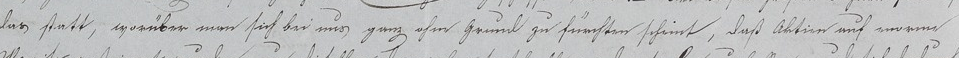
das statt, worüber man sich bei uns ganz ohne Grund zu fürchten scheint, daß Aktien auf enorme
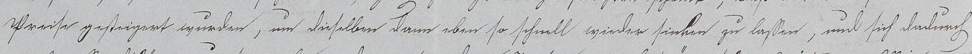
Preise gesteigert wurden, um dieselben dann eben so schnell wieder sinken zu lassen, und sich dadurch
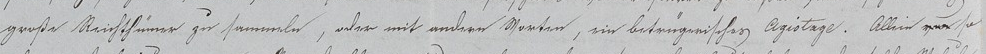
große Reichthümer zu sammeln, oder mit andern Worten, ein betrügerisches Agiotage. Allein von so
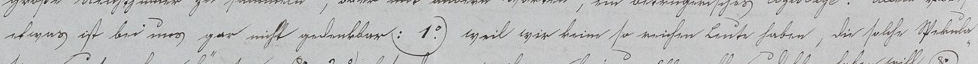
etwas ist bei uns gar nicht gedenkbar: 1o) weil wir keine so reichen Leute haben, die solche Spekula-
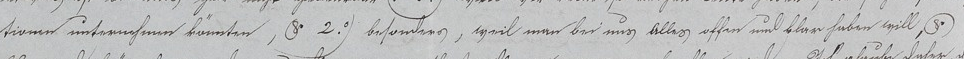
tionen unternehmen könnten, & 2o) besonders, weil man bei uns Alles offen und klar haben will, &
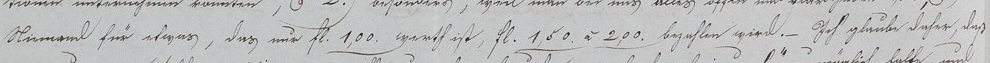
Niemand für etwas, das nur fl. 1,00 werth. ist, fl. 1,50 à 2,00. bezahlen wird. – Ich glaube daher, daß
